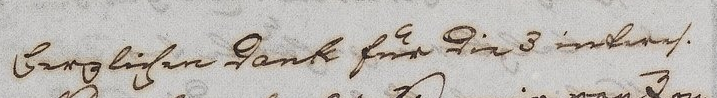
Herzlichen Dank für die 3 interes-
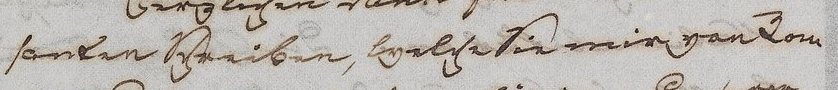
santen Schreiben, welche Sie mir von Rom
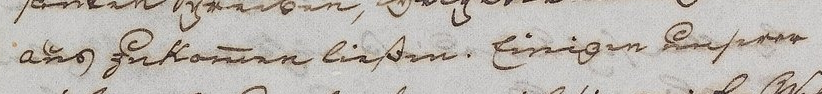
aus zukommen ließen. Einigen unserer
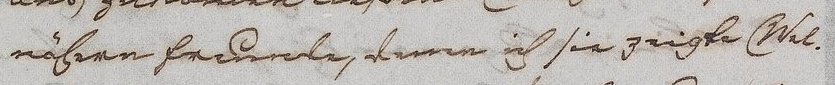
nähern Freunde, denen ich sie zeigte ( Wel-
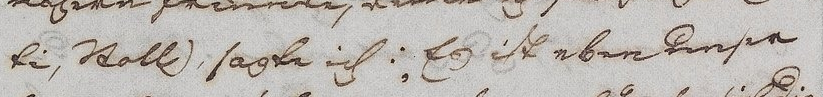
ti, Stoll ), sagte ich: «Es ist eben unser
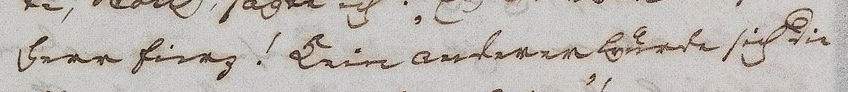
Herr Fierz! Kein anderer würde sich die
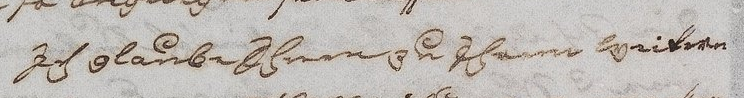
Ich glaube Ihnen zu Ihrem weitern
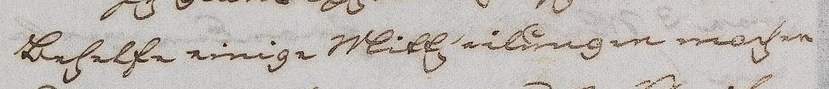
Behelfe einige Mittheilungen machen
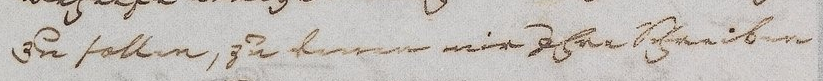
zu sollen, zu denen mir Ihre Schreiben
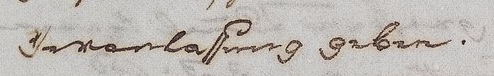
Veranlassung geben.
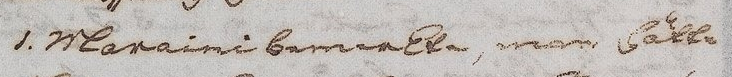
1. Maraini bemerkte, man hätte
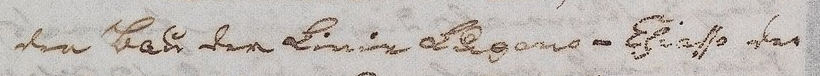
den Bau der Linie Lugano–Chiasso der
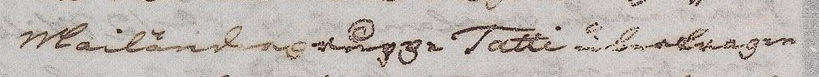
Mailänder gruppe Tatti übertragen
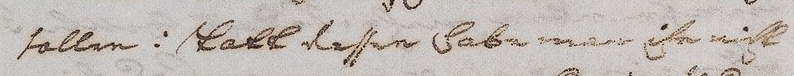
sollen: statt dessen habe man ihr nicht
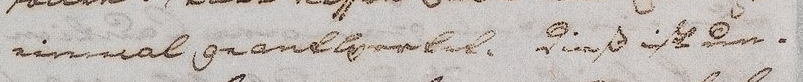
einmal geantwortet. Dieß ist un-
